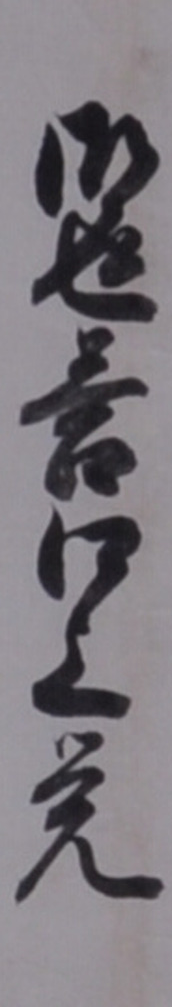御返答口上覚
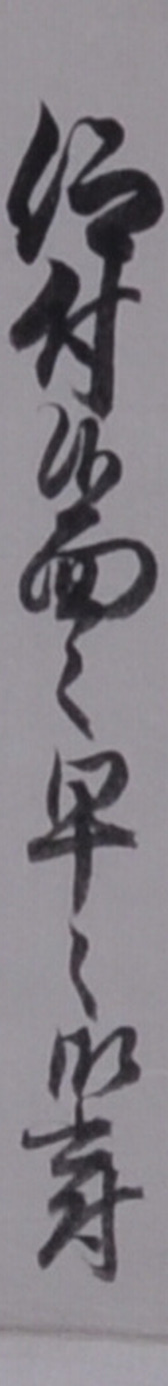仰付候面々早々御書付
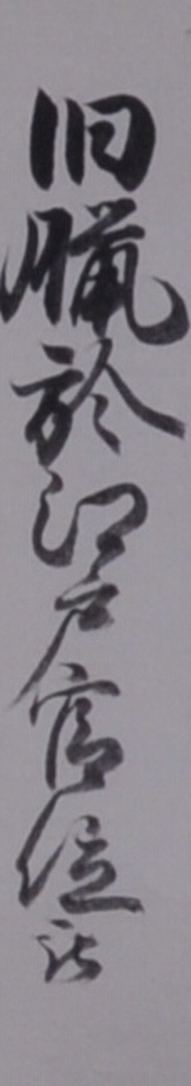旧臘於江戸官位被
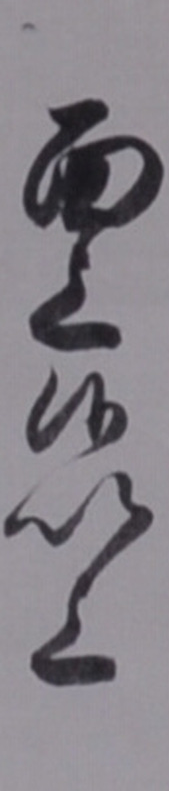面上候以上
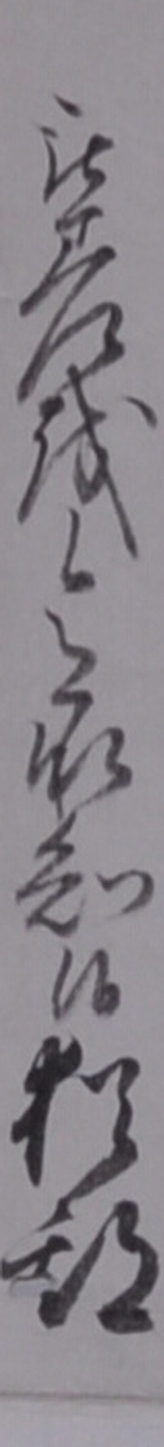被差越令承知候猶期
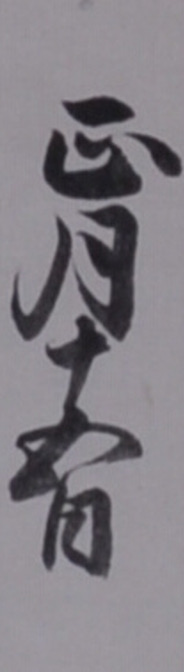正月十五日
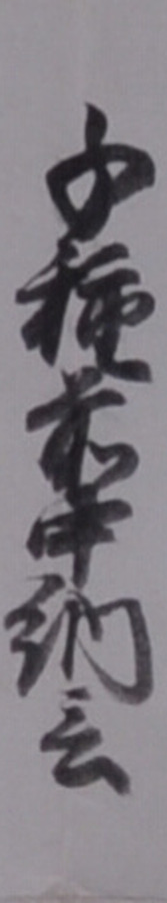千種前中納言
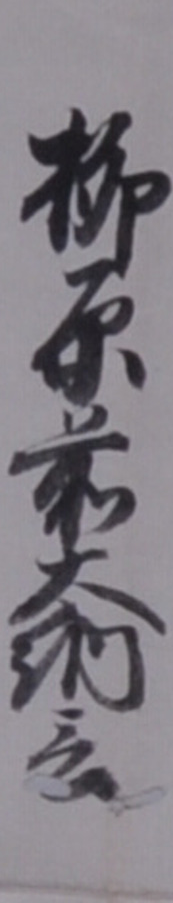柳原前大納言
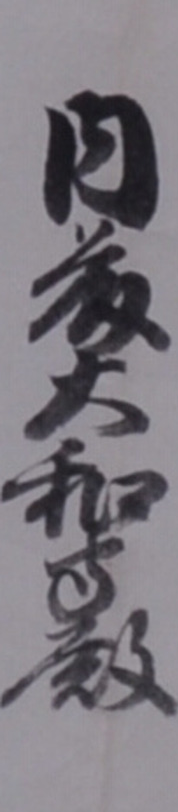内藤大和守殿
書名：御返答口上覚
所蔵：伊那市立高遠町図書館・合同会社AMANE
